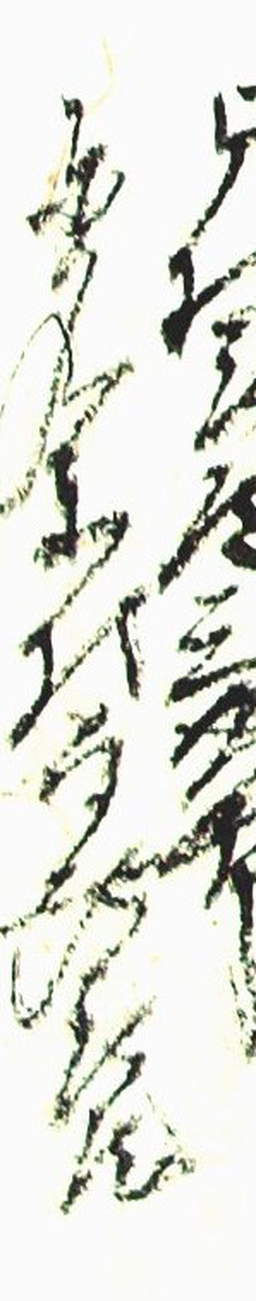東名東村与頭庄屋

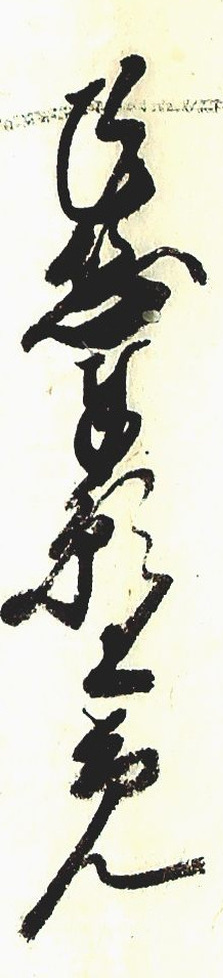乍恐奉願上覚
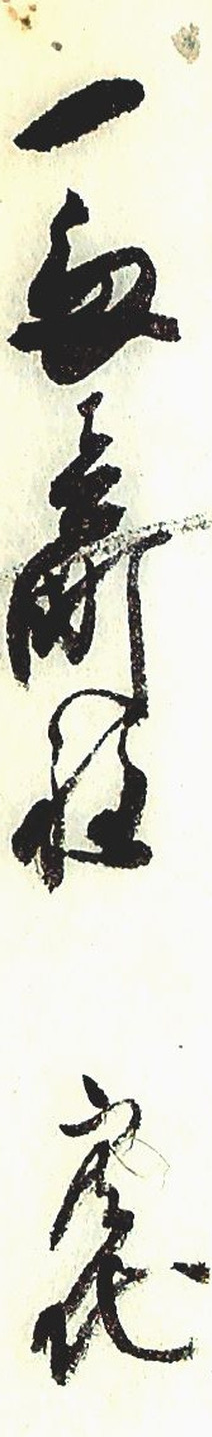一畠壱町程空地
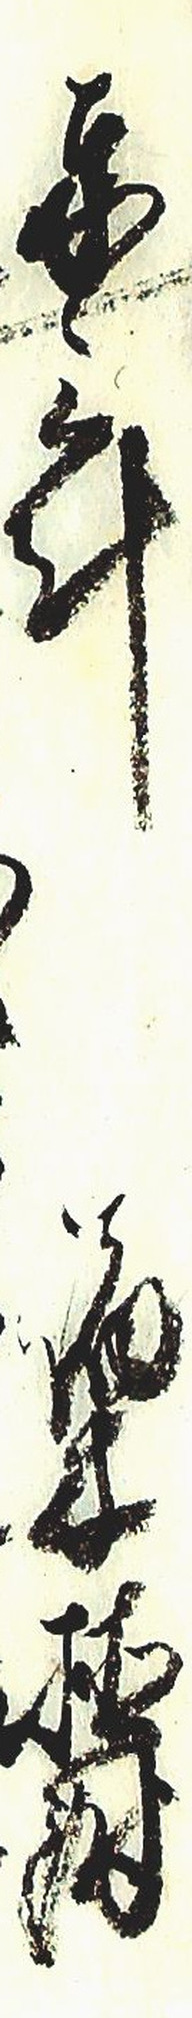米三斗諸木植附
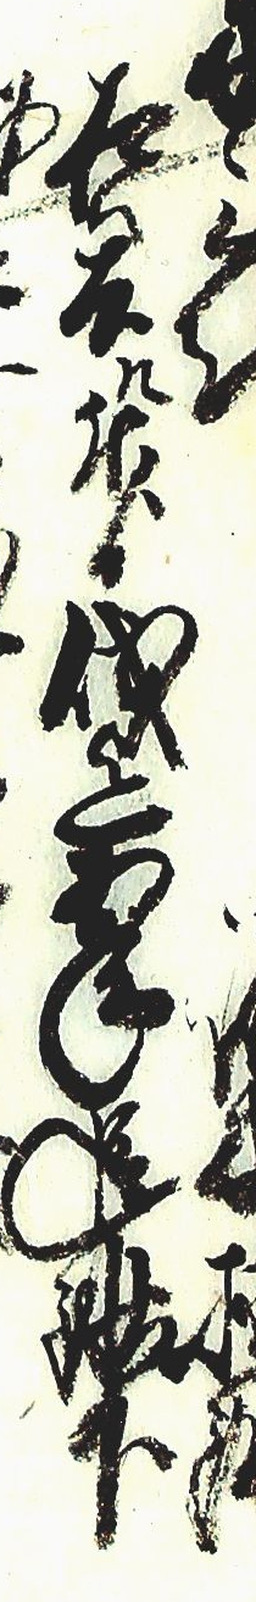右は去る午ゟ戌迄五年追鍬下
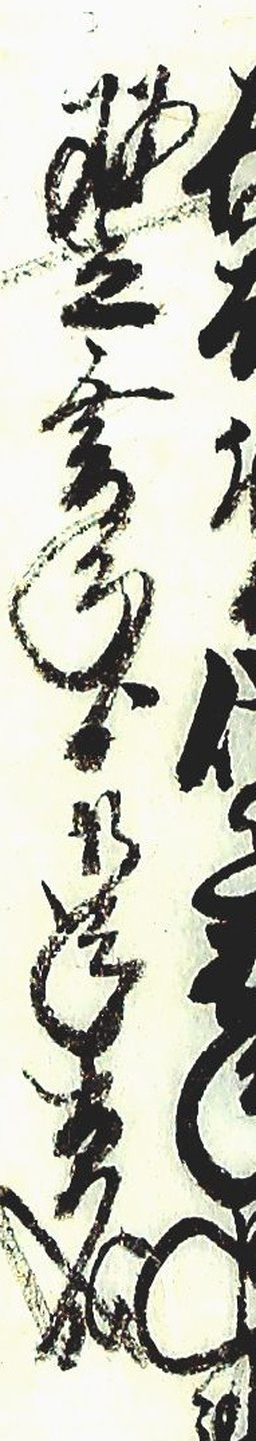翌亥年ゟ御年貢成
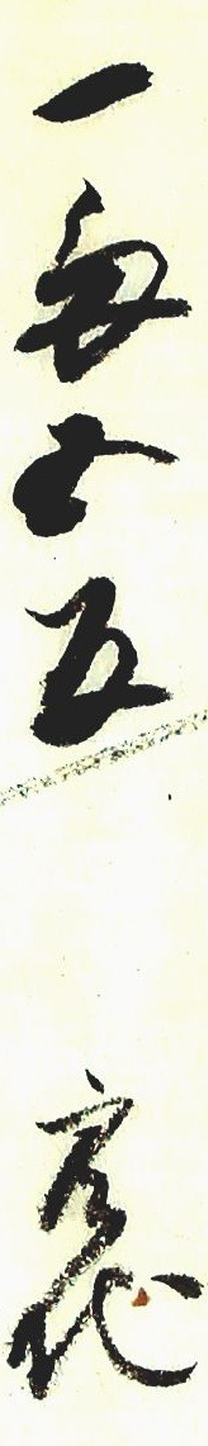一畠五反空地
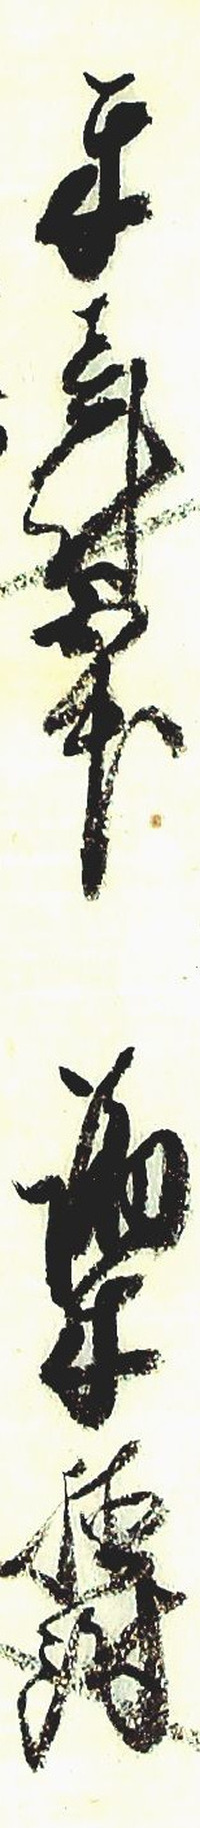米壱斗五升諸木植附
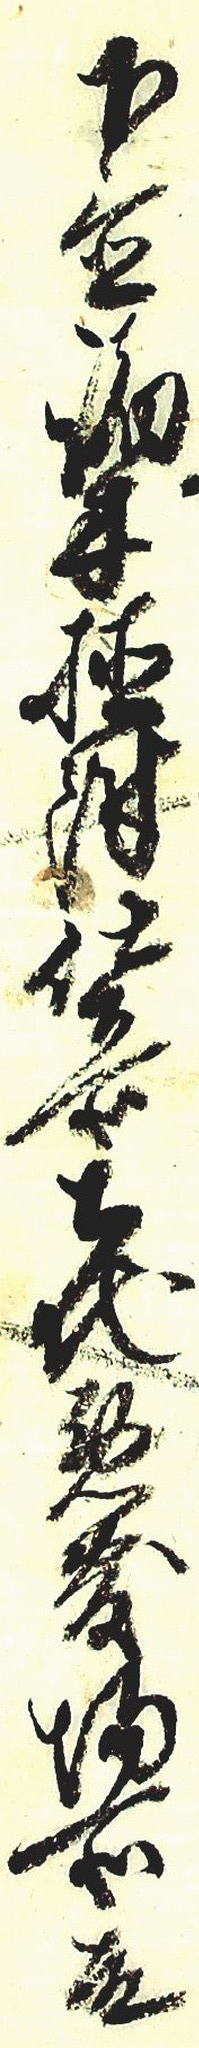下置諸木上附仕候所土地悪敷場所故
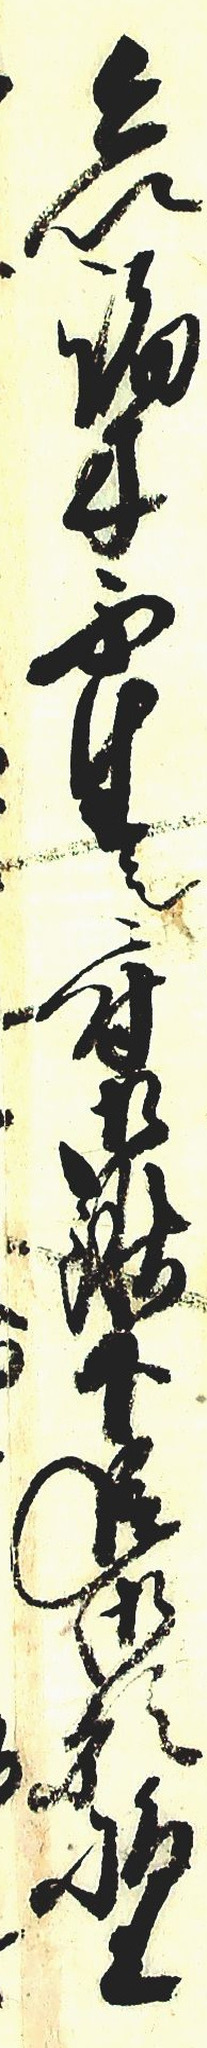今以諸木不生しに付御鍬下追御願指上
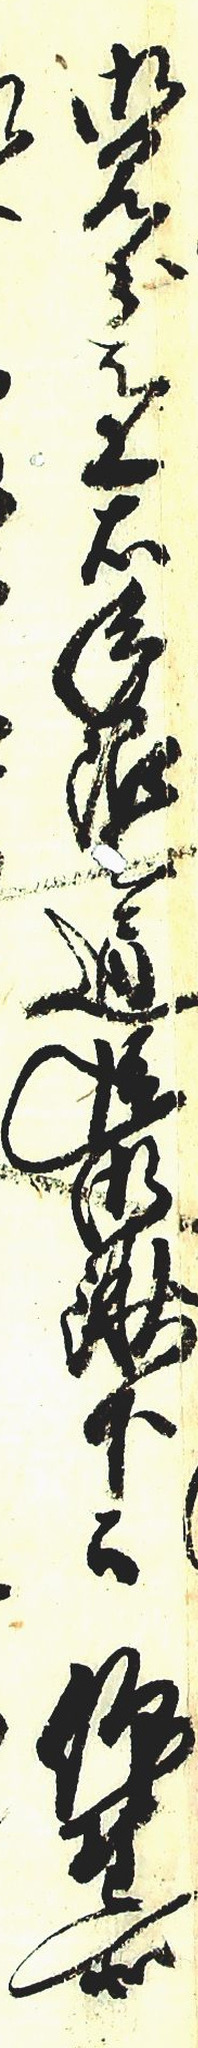御見分之上右年限之通追御鍬下被仰付候所
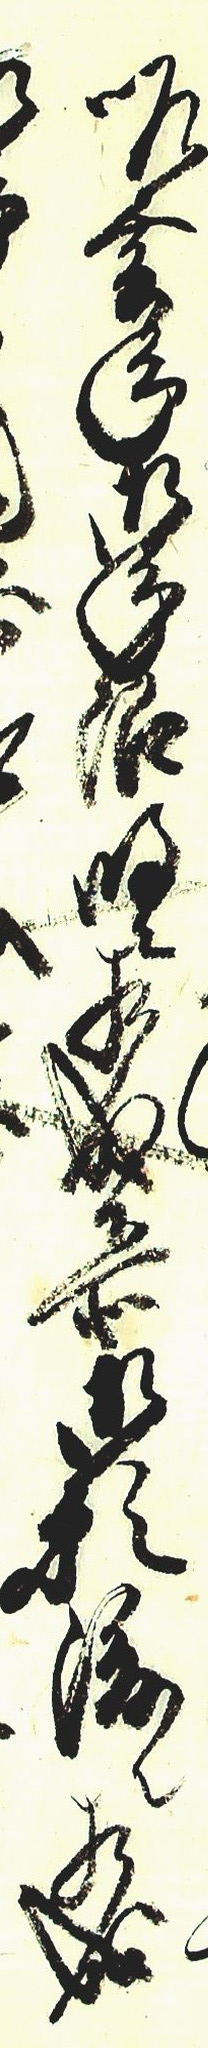昨亥年御年限明に相成候所御願後に相成
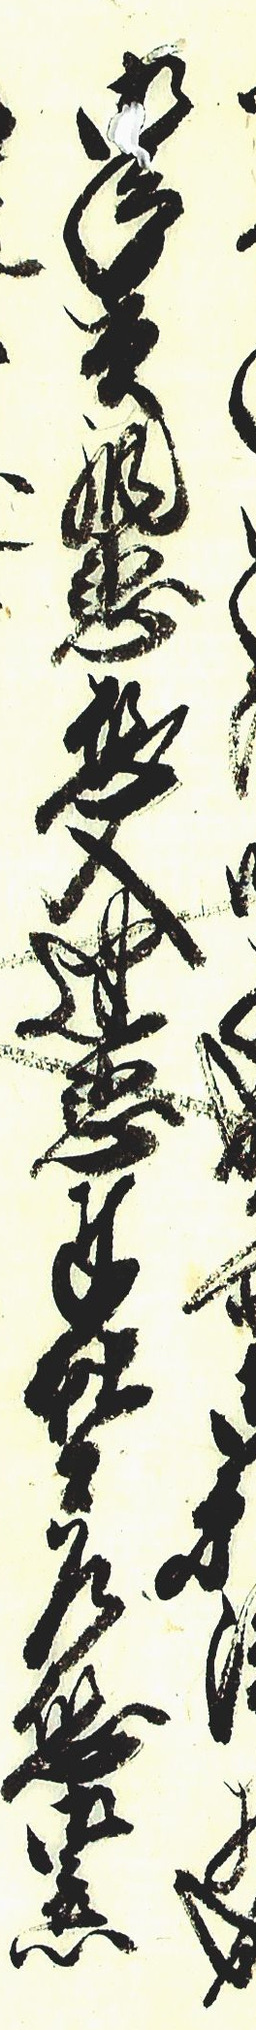御年貢調惑恐入迷惑奉仕候乍恐御慈
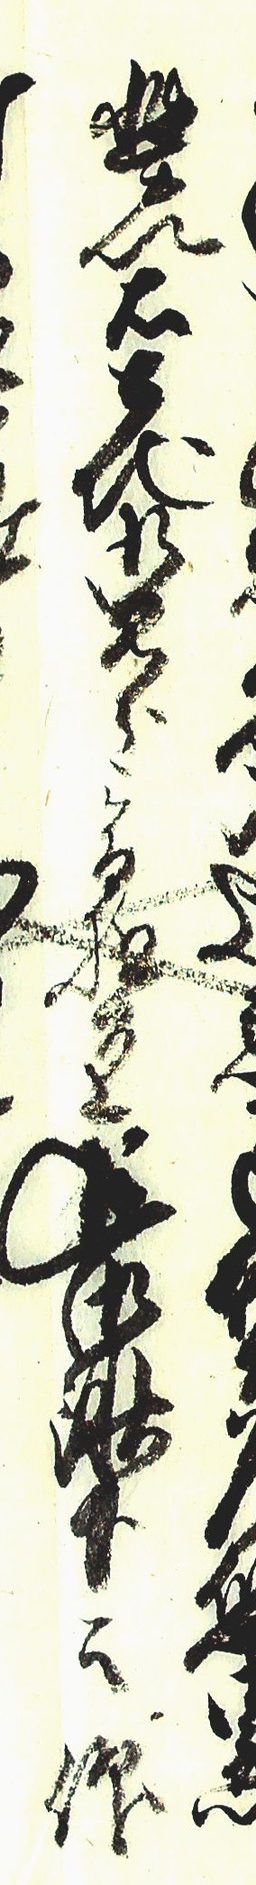悲を以右土地御見分被為遊候上追御鍬下被仰
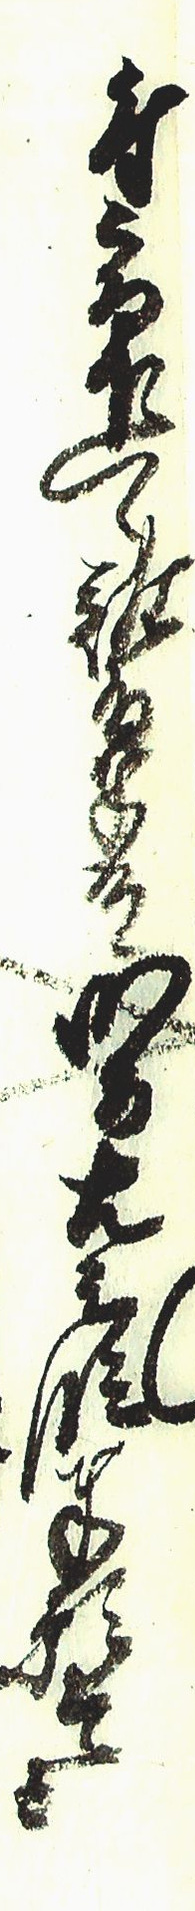付被為下候はゝ難有奉存候仍て右之段奉願上候以上
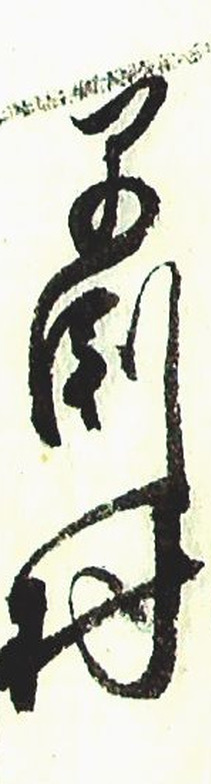早淵村
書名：諸御願書控(弐番）
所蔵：鳴門教育大学 Naruto University of Education
